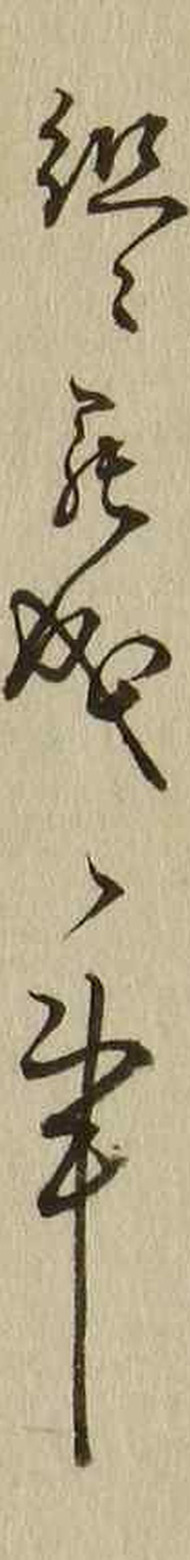組ニ罷成候事
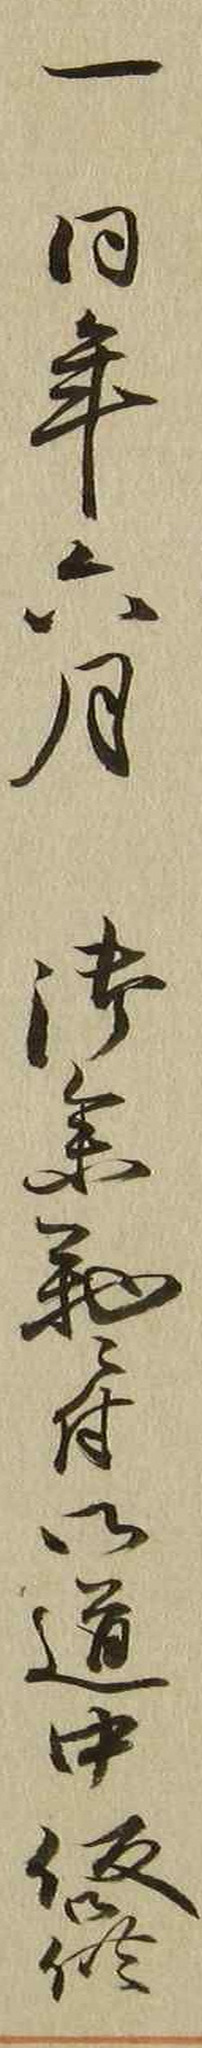一同年六月御参勤ニ付御道中仮御供
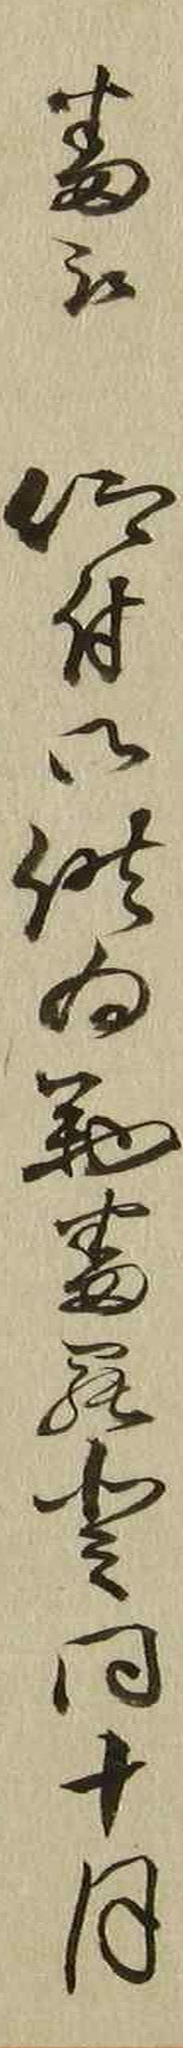番被仰付御供為勤番罷登同十月
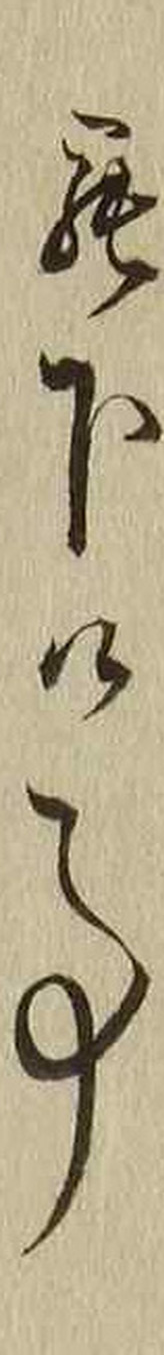罷下候事
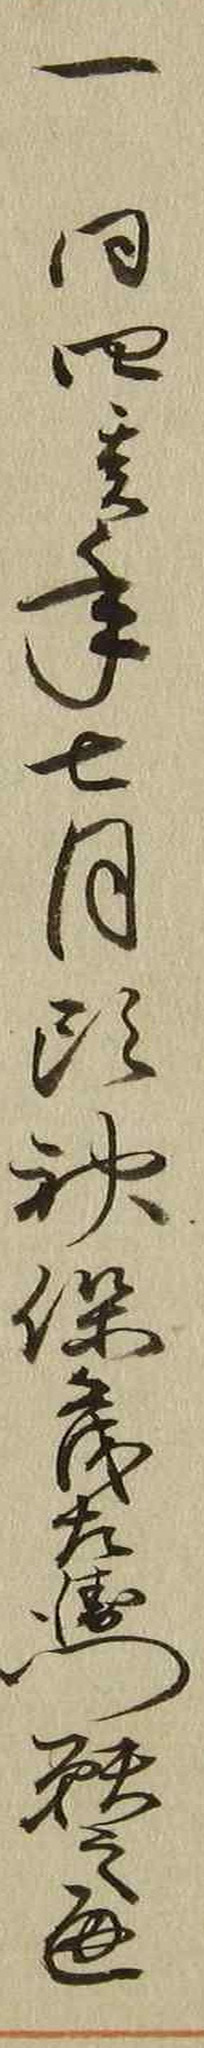一同四亥年七月頭神保茂左衛門願之通
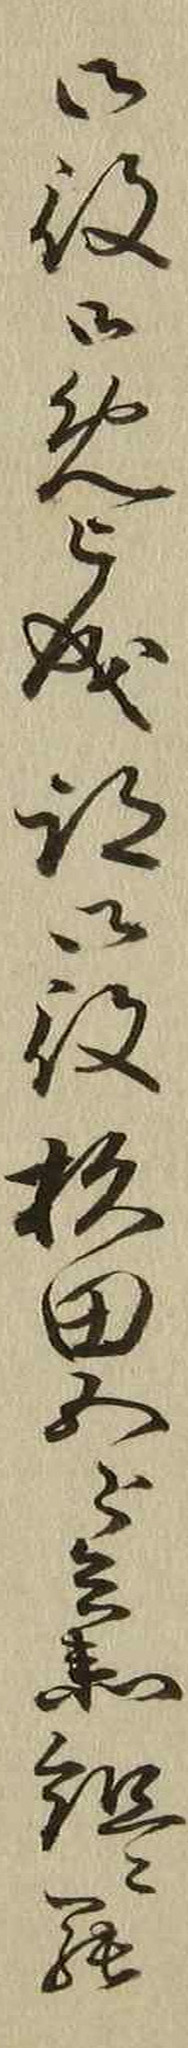御役御免被成跡御役杉田五郎兵衛組ニ罷
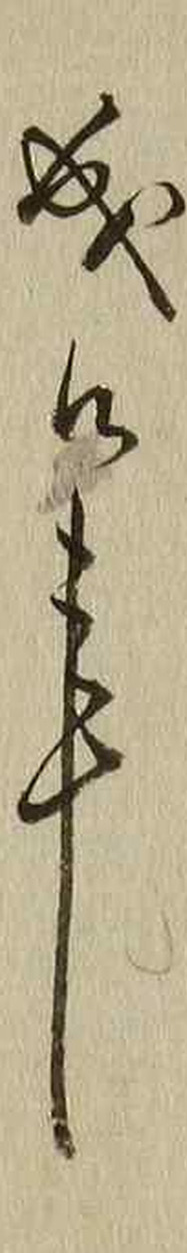成候事
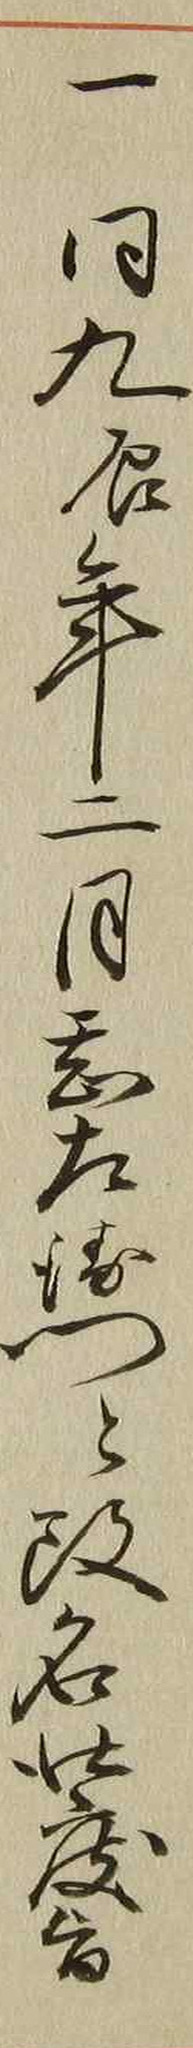一同九辰年二月甚左衛門と改名仕度旨
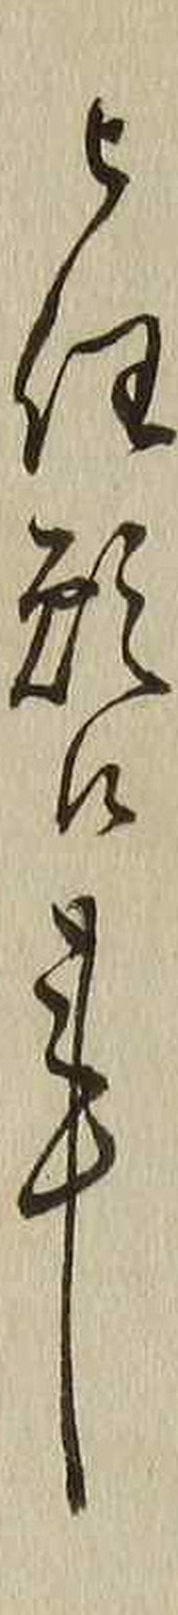被任願候事
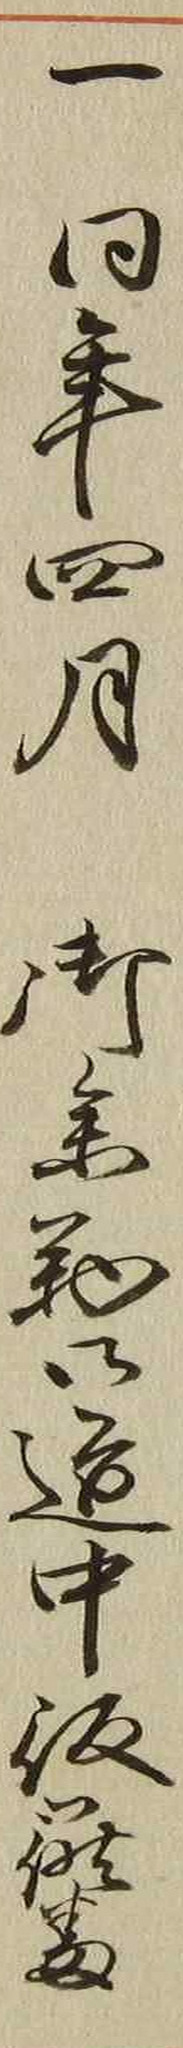一同年四月御参勤御道中仮御供番
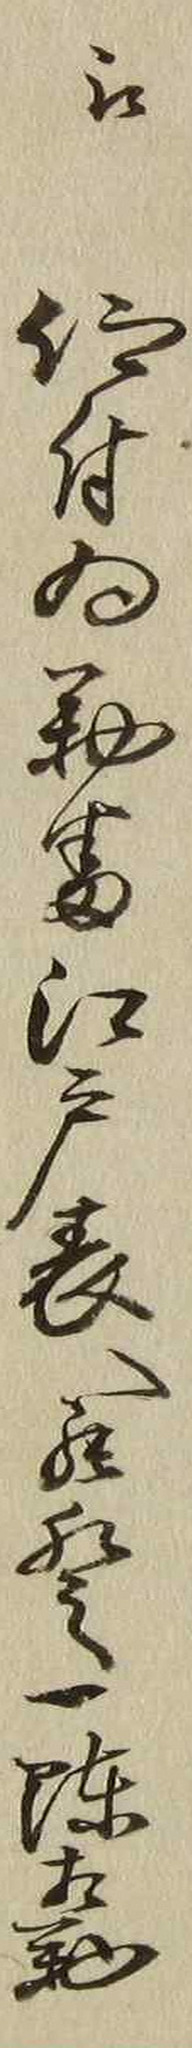被仰付為勤番江戸表へ罷登一陣相勤
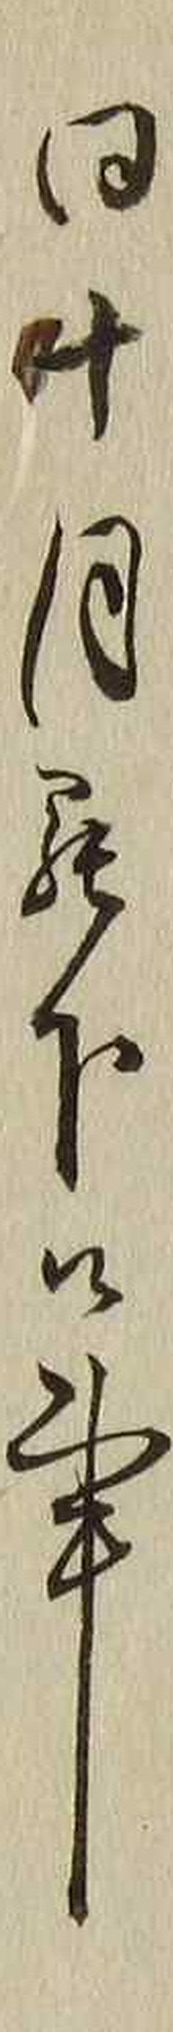同十月罷下候事
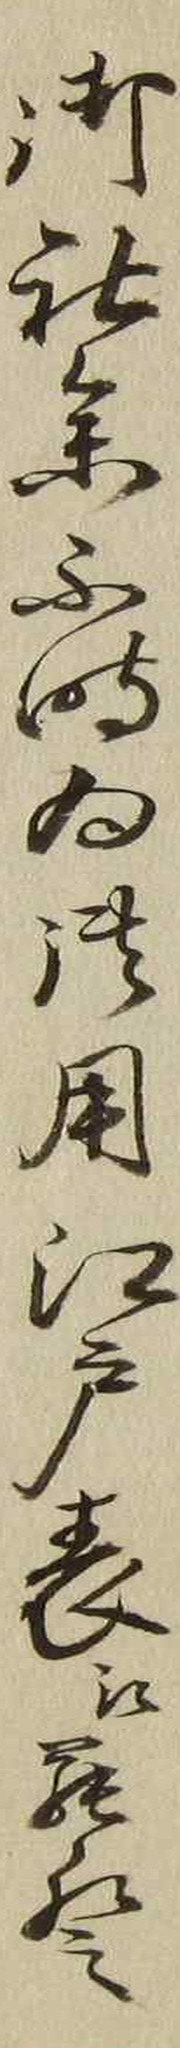御社参不時為御用江戸表江罷登
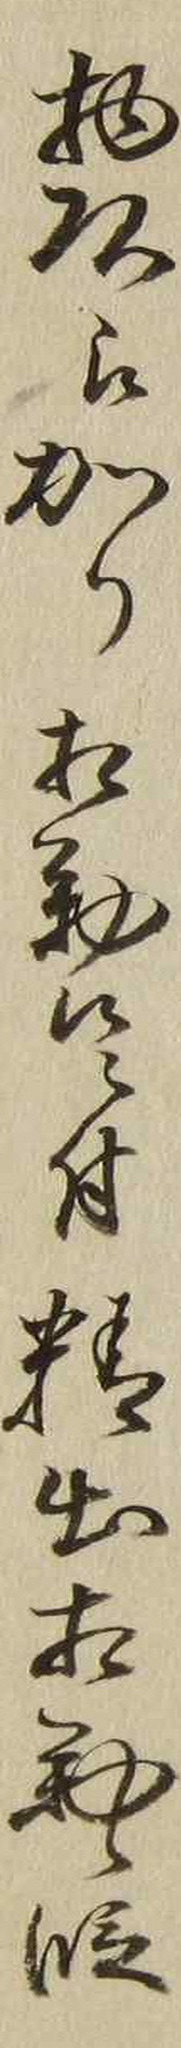物頭江加り相勤候ニ付精出相勤候段
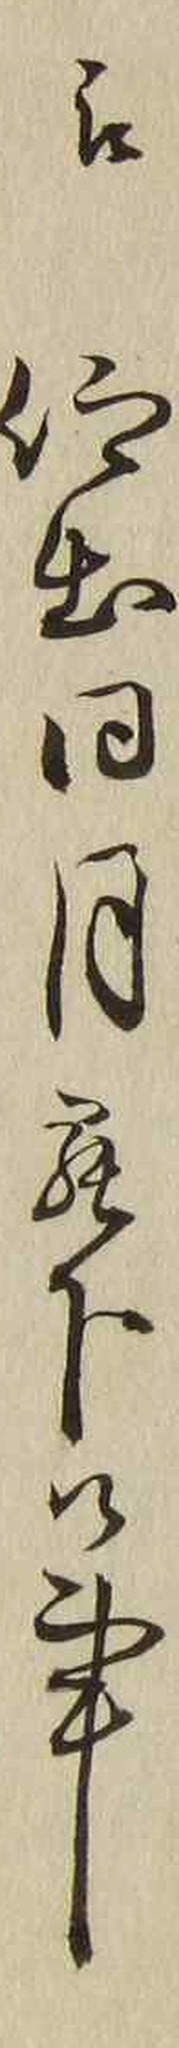被仰出同月罷下候事
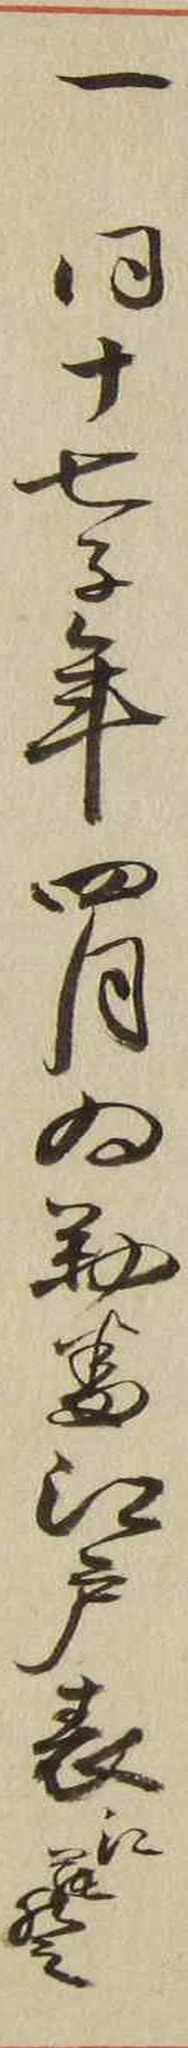一同十七子年四月為勤番江戸表江罷登
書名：諸士系譜　巻之60　と之部3
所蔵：会津若松市立会津図書館
